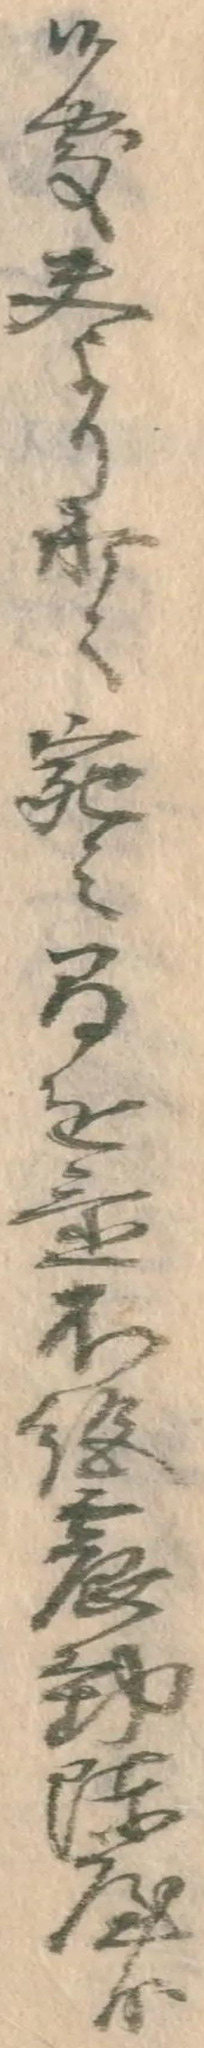候処夫より少々宛之間を置不絶震動陣屋ゟ
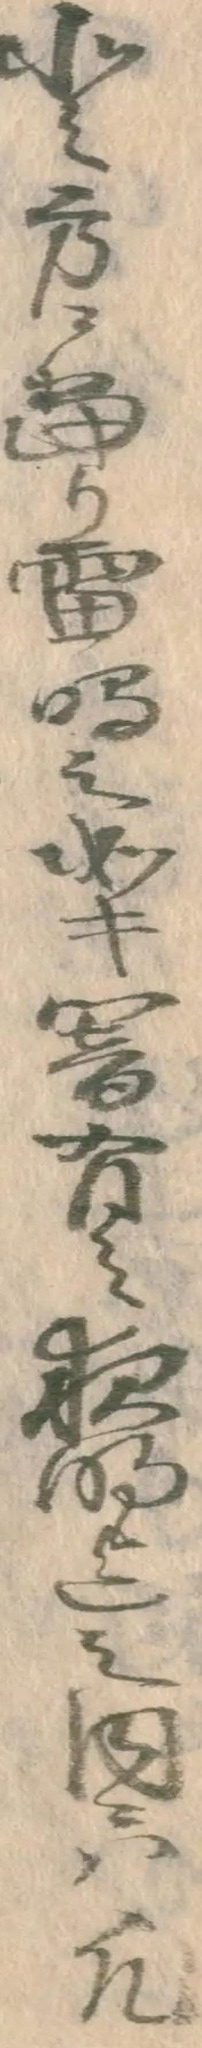北之方ニ当り雷鳴之如キ響き有之夜明迄之内ニハ凡
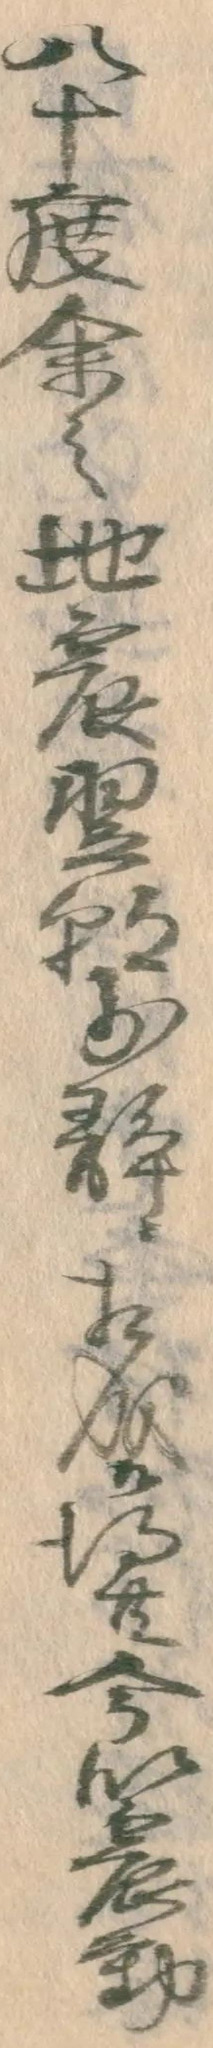八拾度余之地震翌朝少静ニ相成候得共今以震動
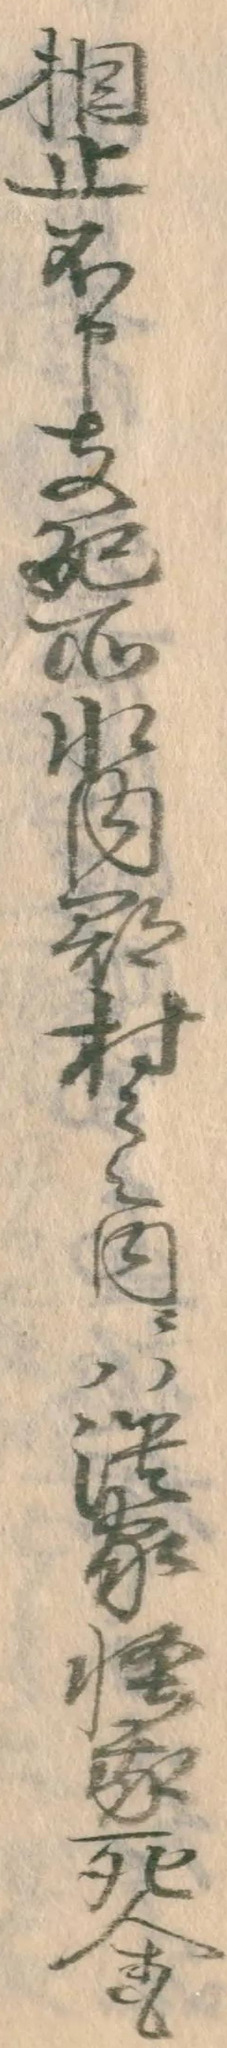相止不申支配所水内郡村々之内二ハ潰家怪我死人等も
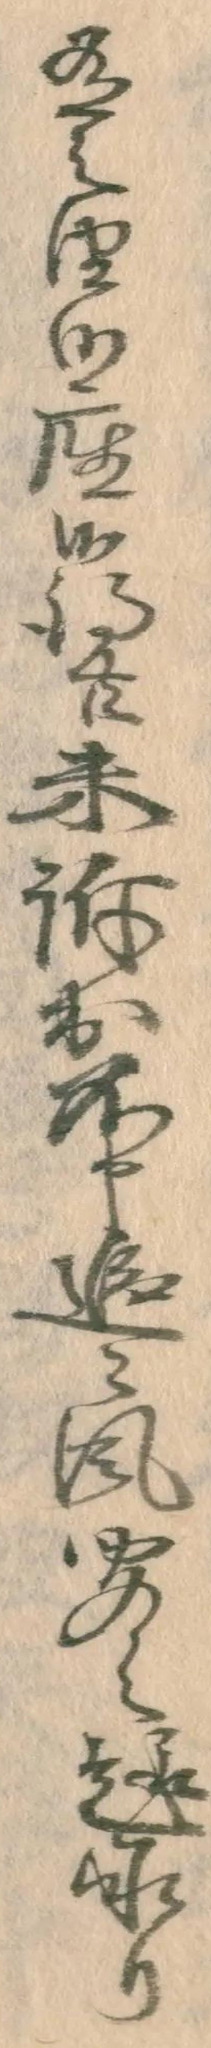有之候由ニ御座候得共未訴出不申追々風聞之趣承り
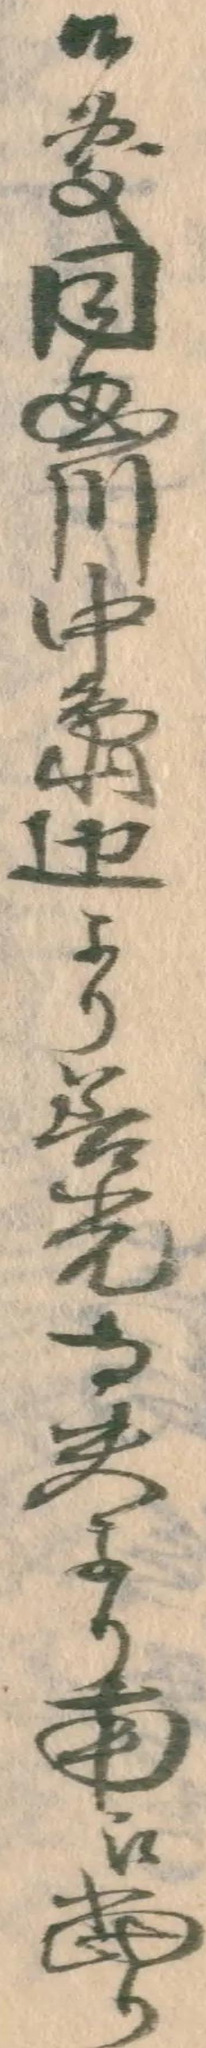候処同国川中島辺ゟ善光寺夫より南江当り
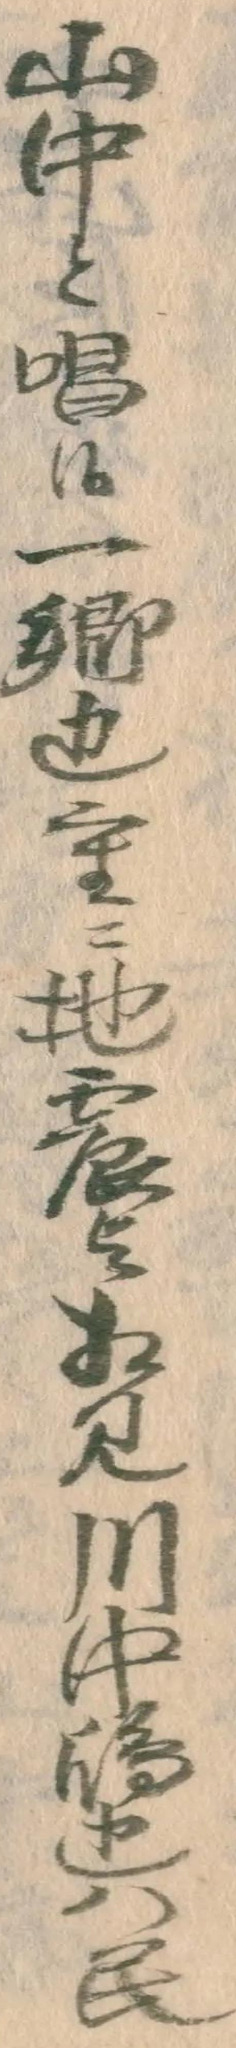山中と唱候一郷村辺重二地震と相見川中島辺ハ民
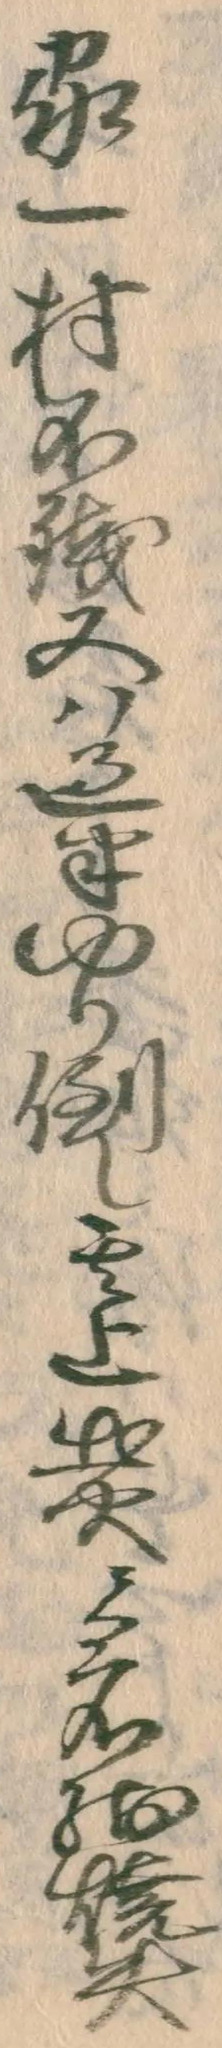家一村不残又は過半ゆり倒し其上出火二而不残焼失
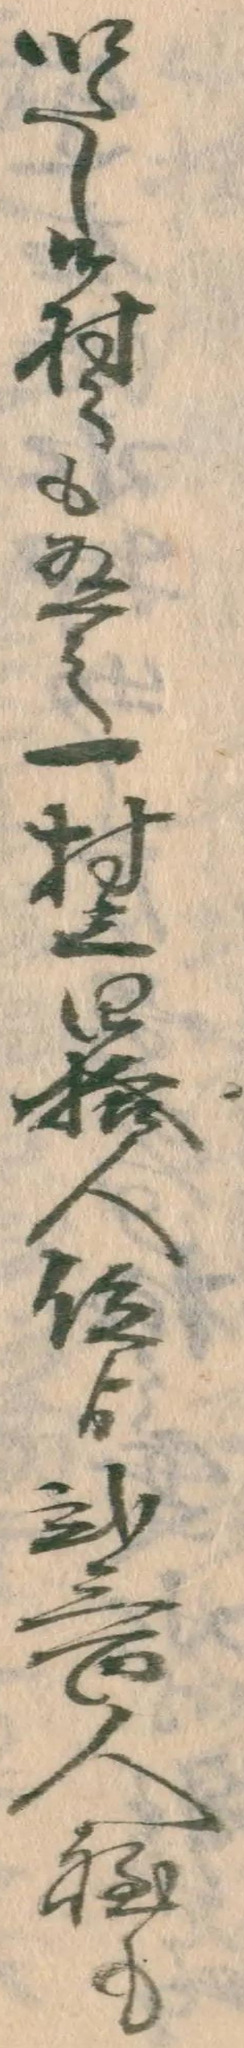いたし候村々も有之一村三四拾人位ゟ二三百人程も
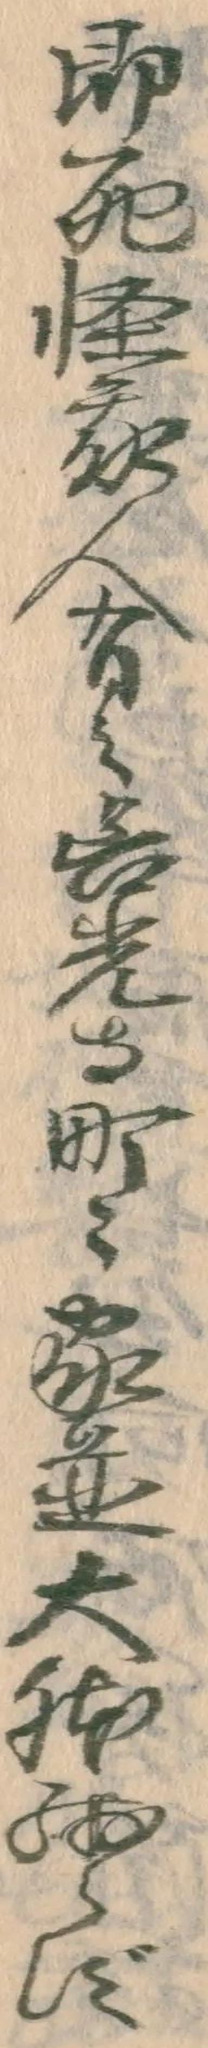即死怪我人有之善光寺町々家並大体残らず
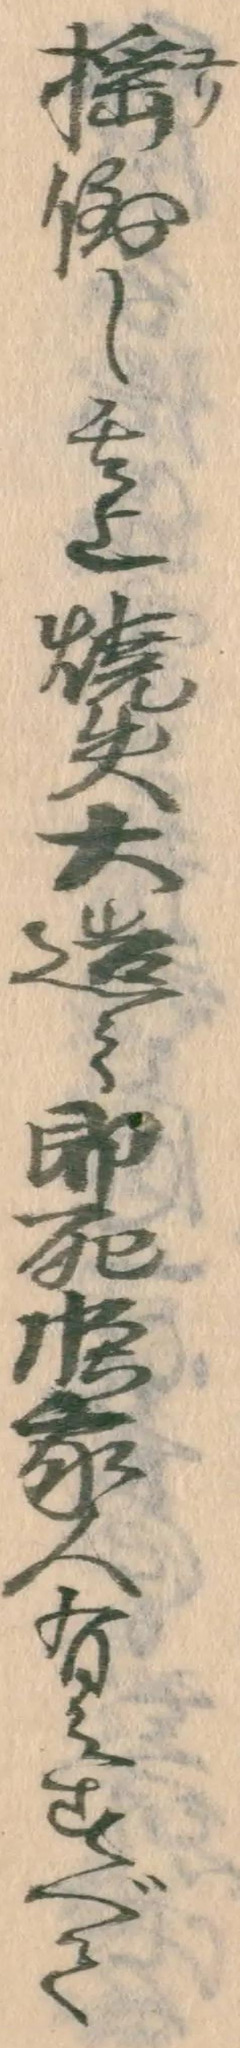揺倒し其上焼失大造之即死怪我人有之すべて
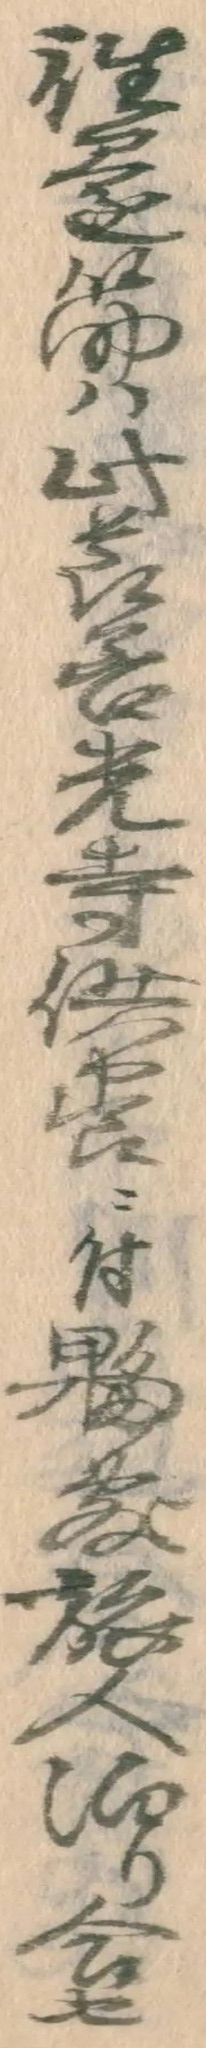往還筋ハ此善光寺供養ニ付夥敷旅人泊り合せ
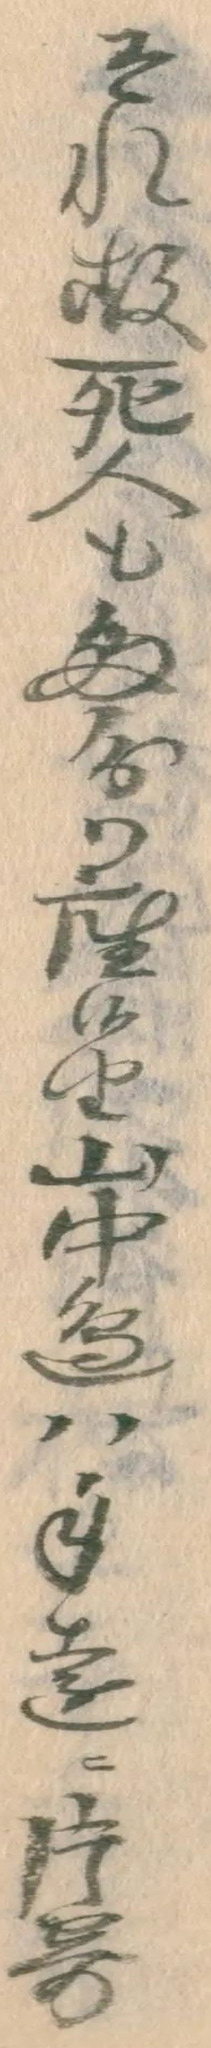それ故死人も多分御座候由山中辺ハ手遠二片寄
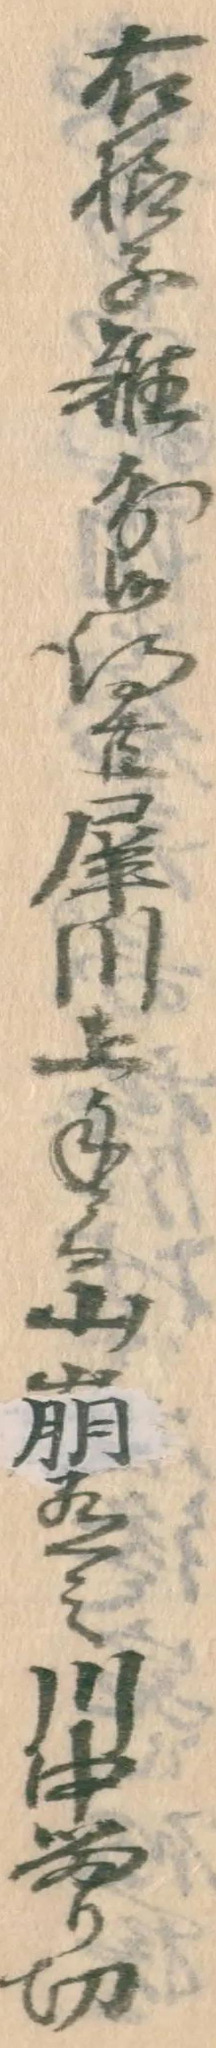右様子難分候得共犀川上手ニ而山崩有之川中留り切
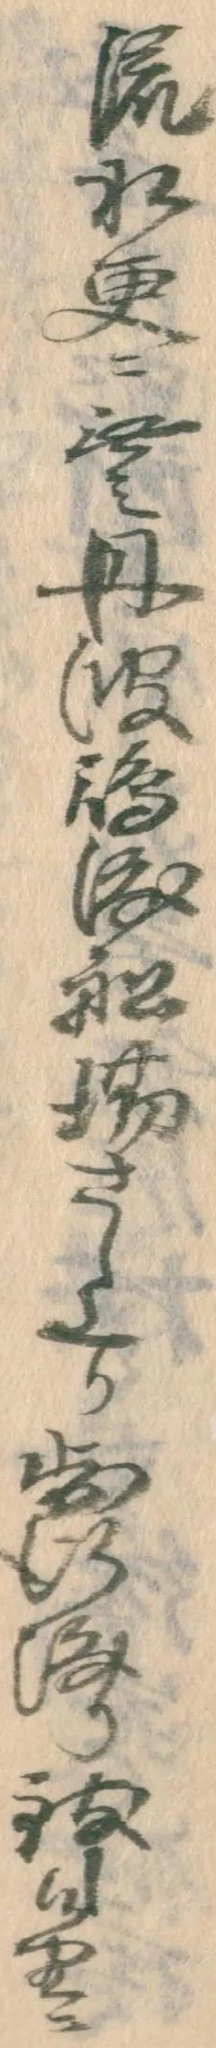流水更ニ無之丹波島渡船場さし上り歩行渡り致候由ニ
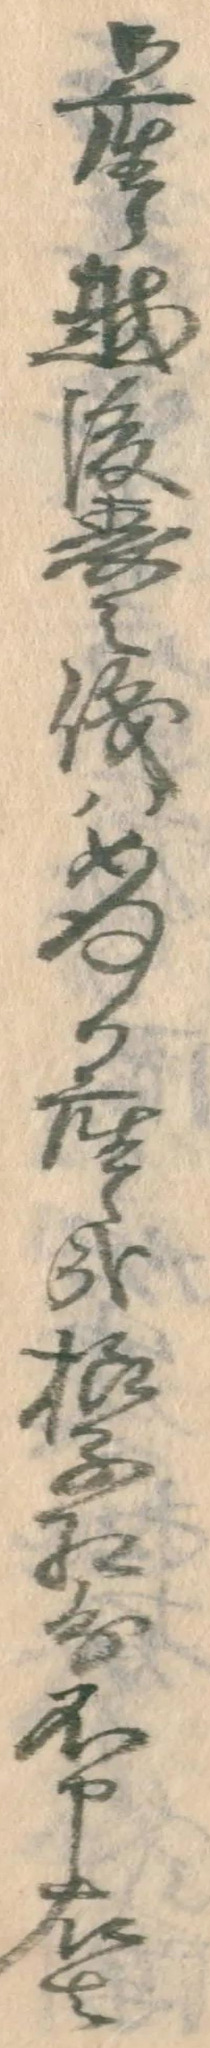御座候越後表之儀ハ如何御座候哉様子相分不申右者
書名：信州大地震之記
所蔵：国立国会図書館 National Diet Library, JAPAN
